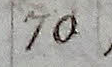70
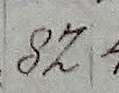82
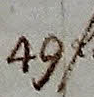49
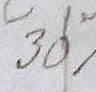30
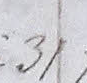31
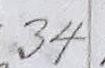34
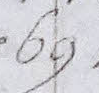69
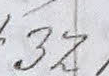32
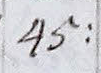45
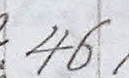46
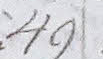49
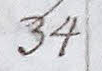34
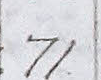71
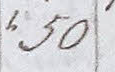50
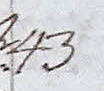43
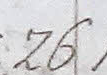26
